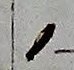1
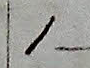1
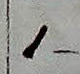1
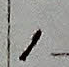1
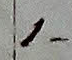1
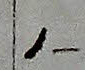1
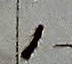1
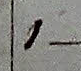1
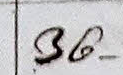36
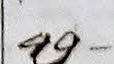49
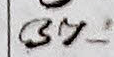37
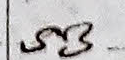53
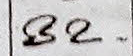32
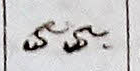55.
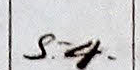54
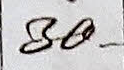30
